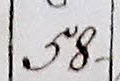58
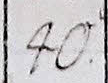40
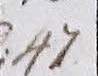47
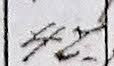42
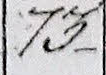73
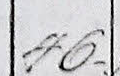46
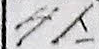41
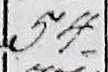54
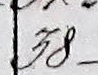38
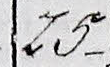25
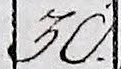30
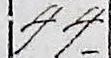44
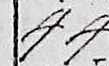44
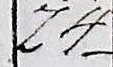24
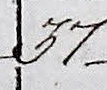37
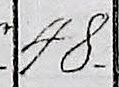48
